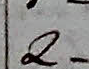2
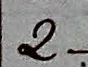2
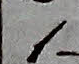1
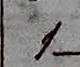1
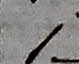1
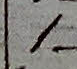1
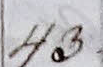43
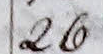26
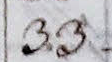33
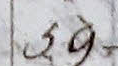59
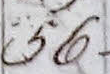56
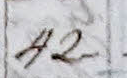42
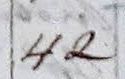42
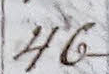46
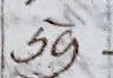59
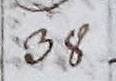38
